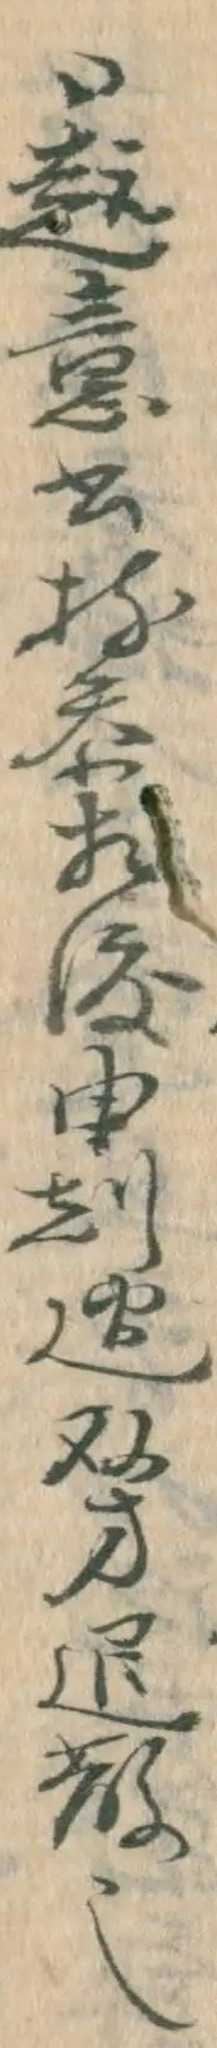御趣意書持参相渡申刻過双方退散也
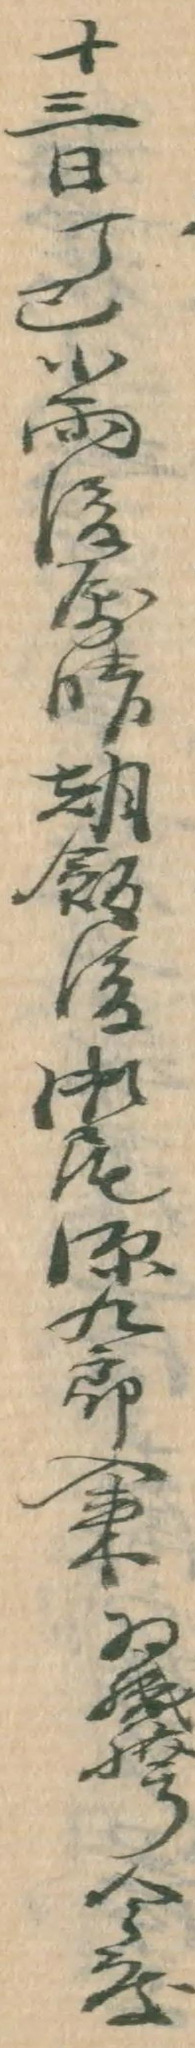十三日丁巳小雨後属晴朝飯後瀬尾源九郎入来為織袴今度

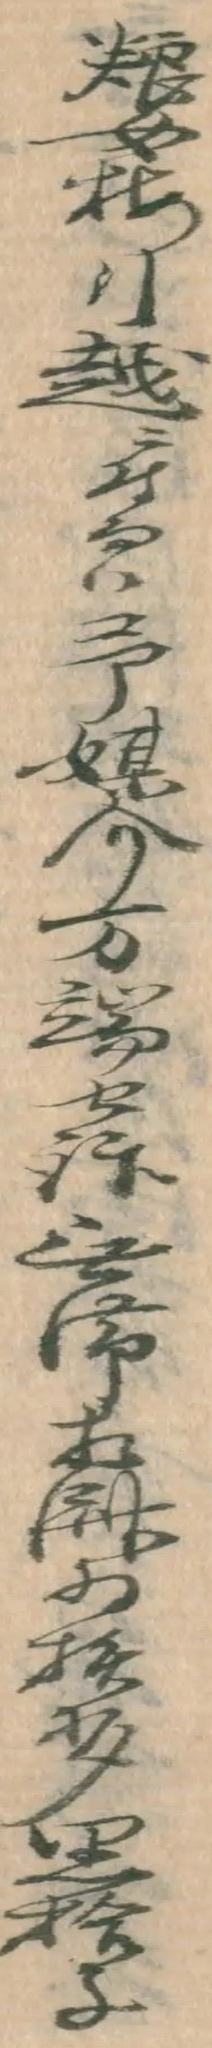養女梅引越ニ付而ハ予媒介万端世話無滞相済為挨拶思拾子
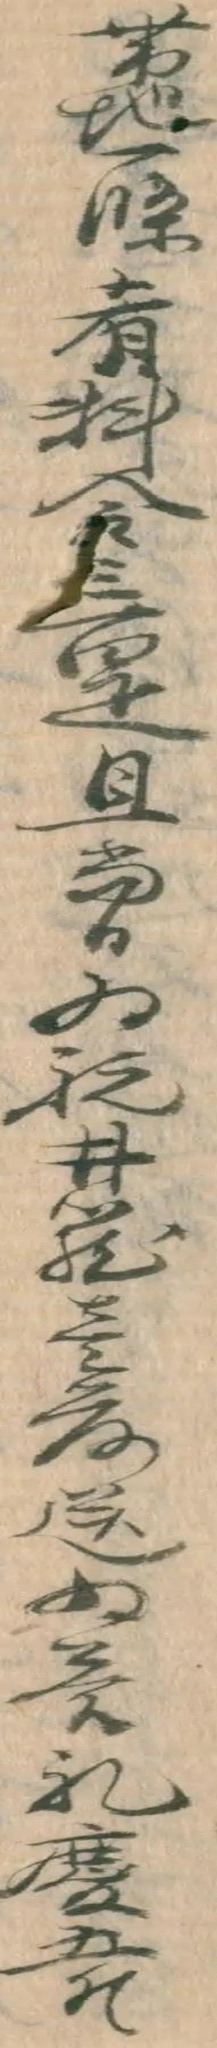帯地一條肴料合三百疋且當日為祝井蔵壱荷送為答礼慶五郎
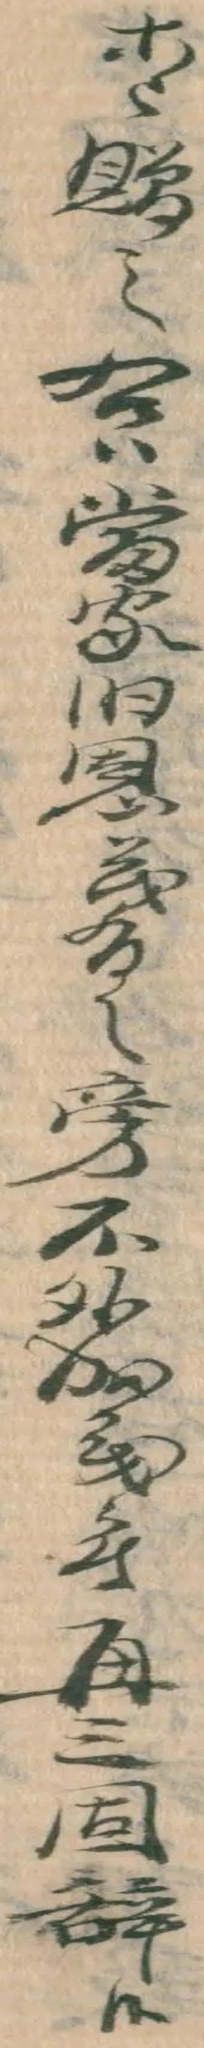等被贈之右ハ當家旧恩茂有之旁不外成義ニ付再三固辞候
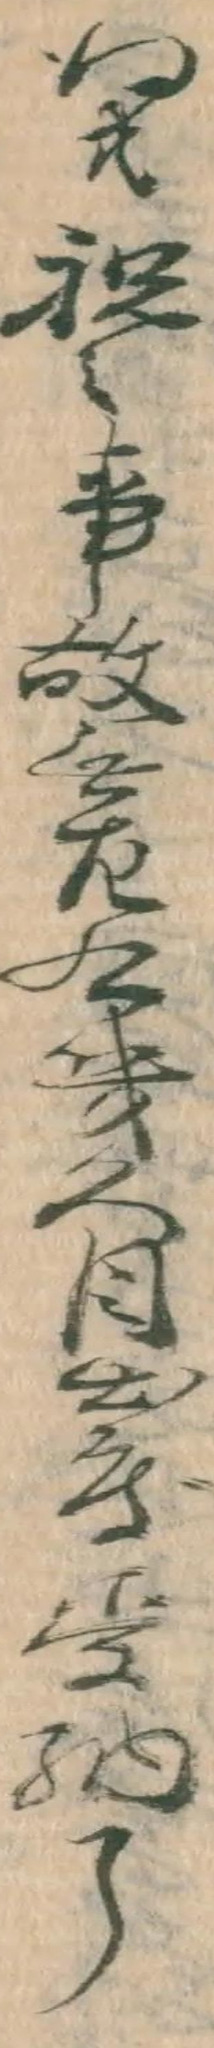候得共祝之事故無左右幾人目出度受納了
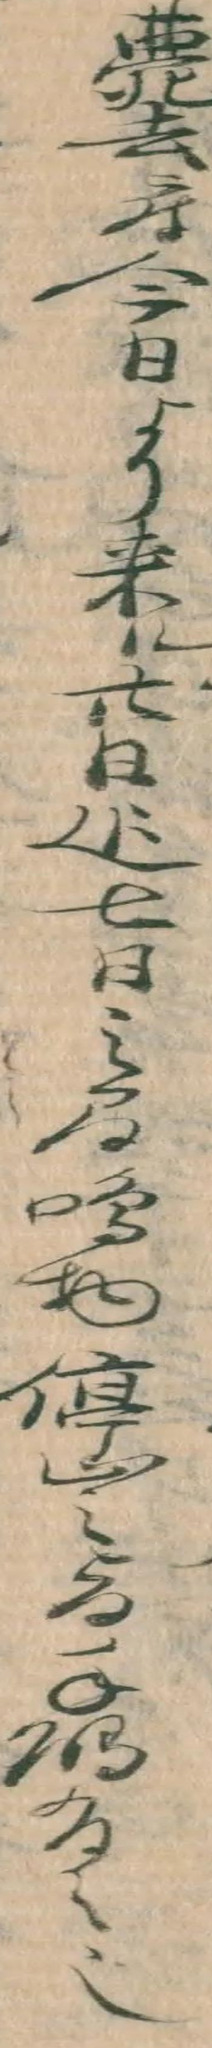薨去ニ付今日より来ル廿日迄七日之間鳴物停止之旨手触有之也
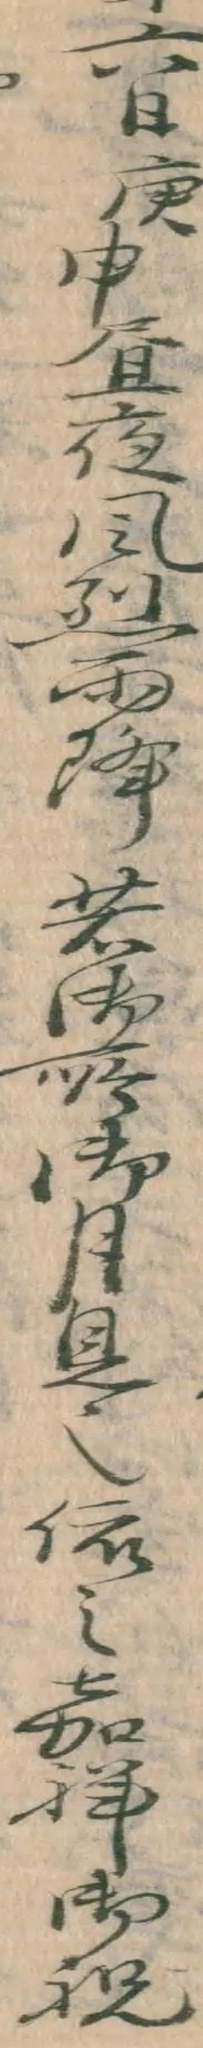十六日庚申昼夜風烈雨降若御所御月見之依之嘉祥御祝
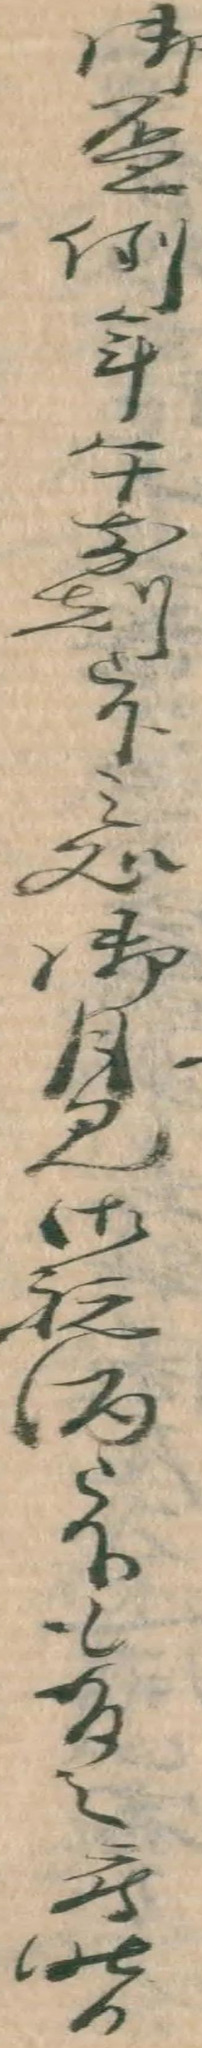御盃例年午前刻被下之処御月見御祝酒被下も有之ニ付昨日
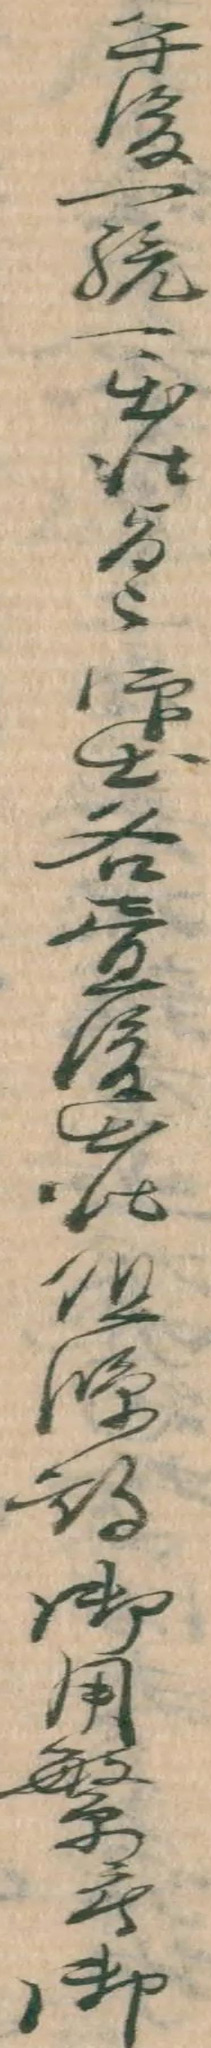午後一統可出仕旨被仰出各昼後出仕但臨期御用繁ニ付御
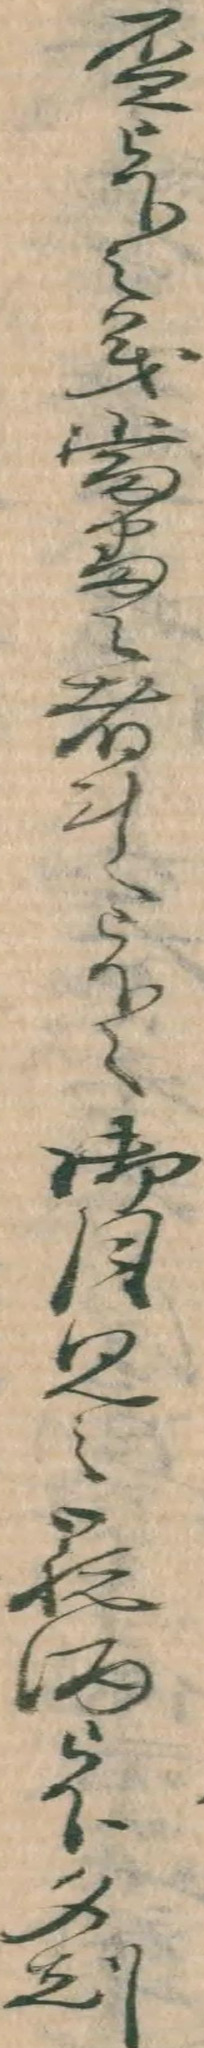盃被下候義當番之者斗へ被下之御月見之御祝酒被下夕刻
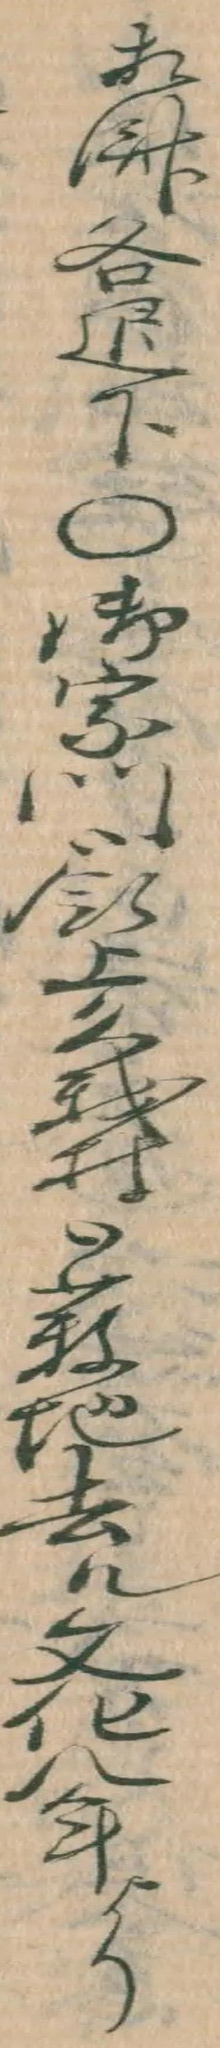相済各退下○御家門御領上久我村御藪地去ル文化八年より
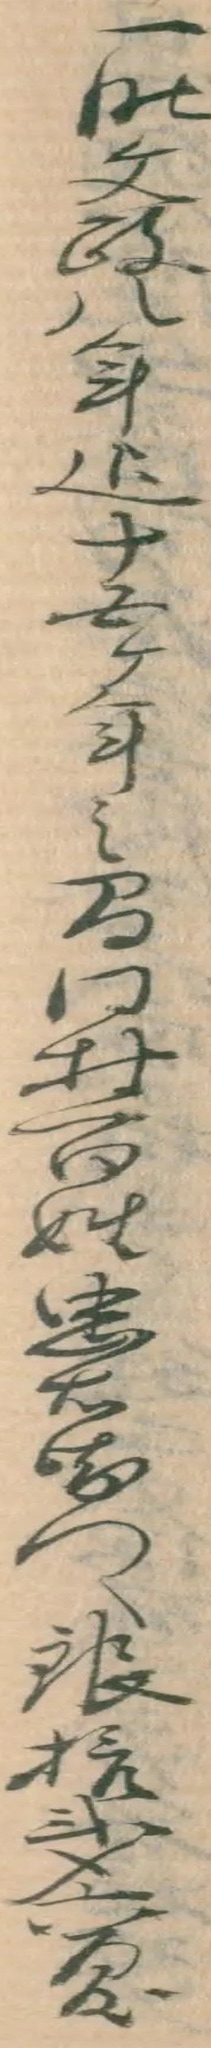一昨文政八年迄十五ケ年之間同村百姓忠右衛門銀拾弐〆六百匁
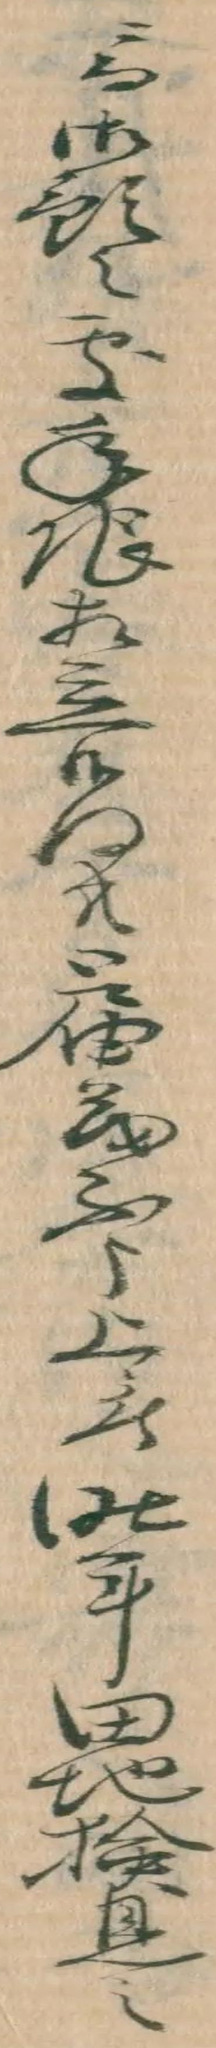ニ而御預之處年限相立候得共御届も不申上ニ付昨年田地検見之
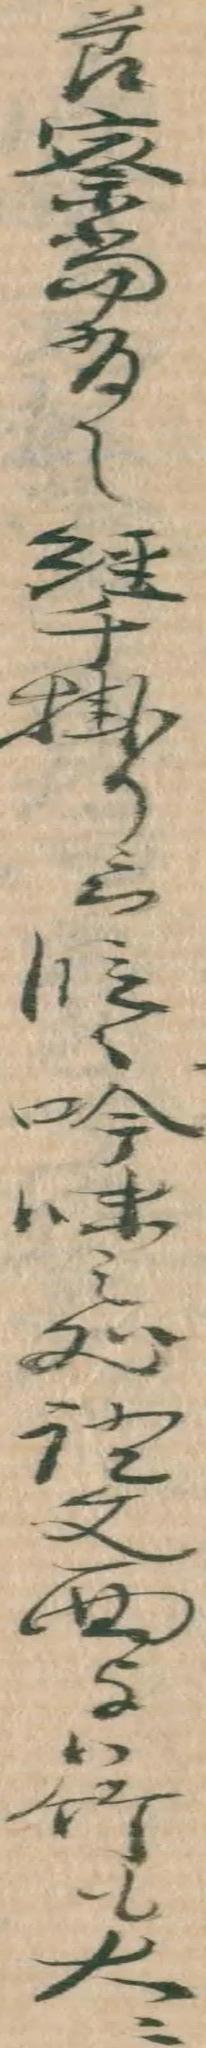節察當有之経千掛リニ而段々吟味之処證文面とハ竹も大に
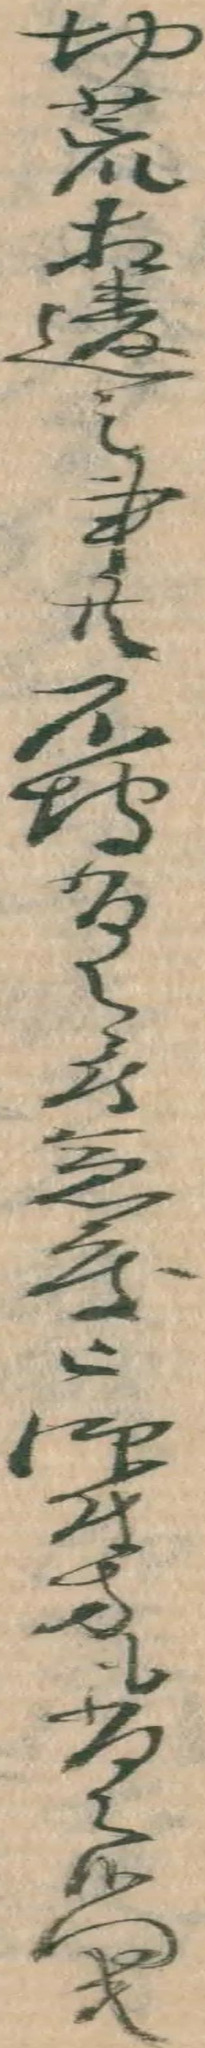切荒相違之事共不埒有之ニ付急度被仰付方も有之候得共
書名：賀茂社記録. 第65冊
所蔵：国立国会図書館 National Diet Library, JAPAN
